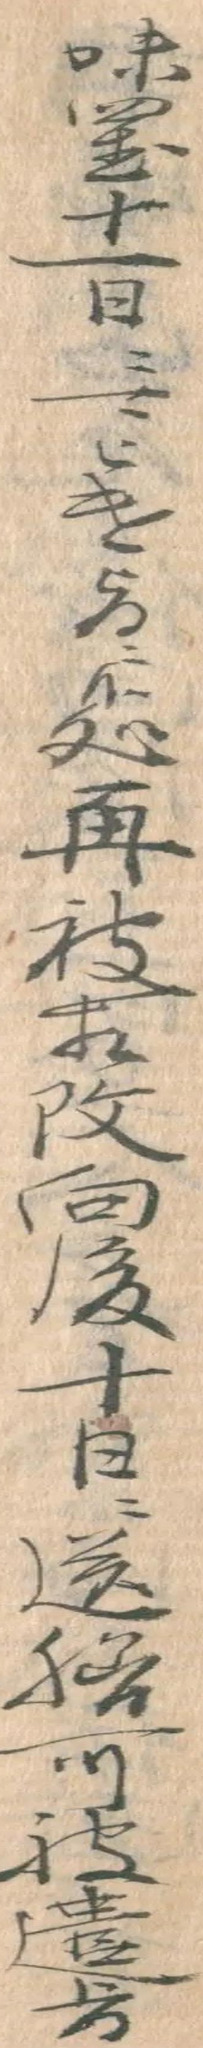味置十一日ニ可被遣旨ニ候処再被相改向後十日ニ送膳可被遣旨
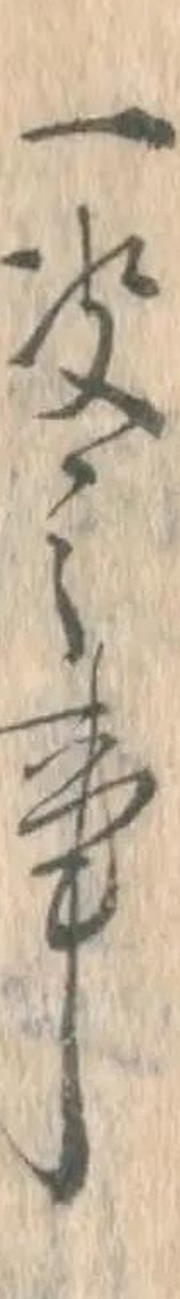一決之事
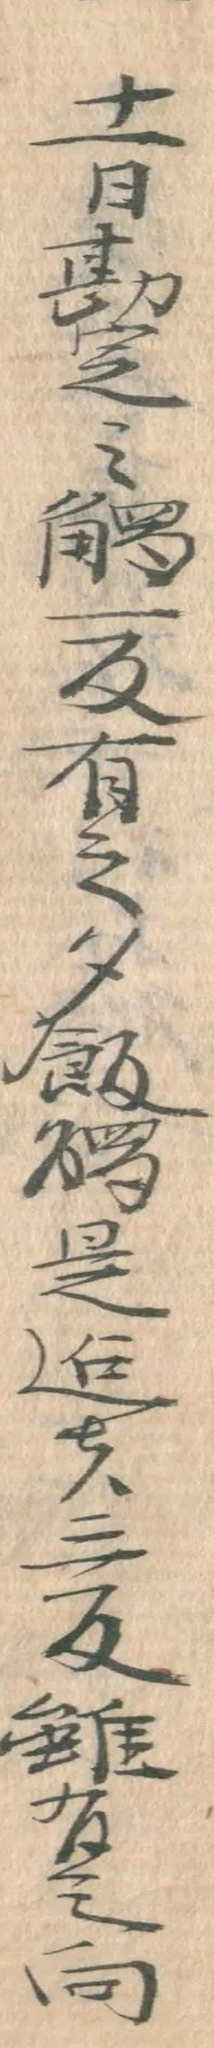一十一日勘定之觸一反有之夕飯觸是迄は三反雖有之向
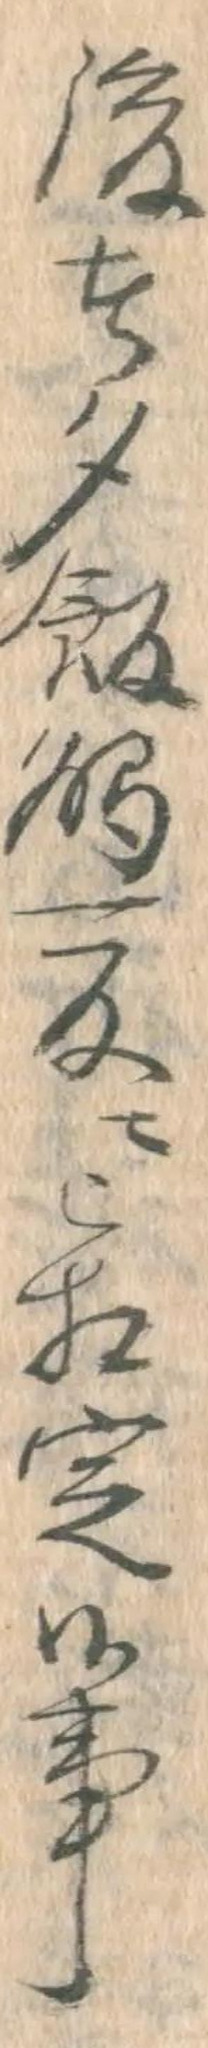後本夕飯觸一反ニ被相定候事
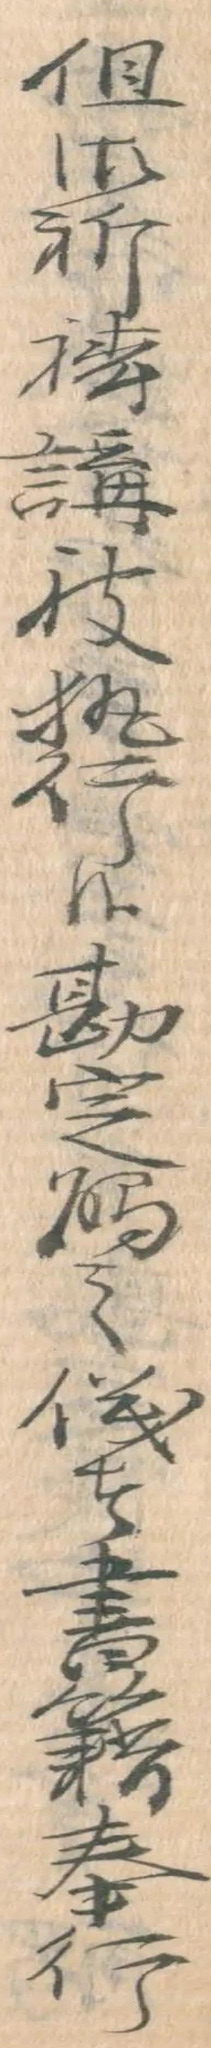但御祈祷講被執行候勘定觸之儀は書籍奉行

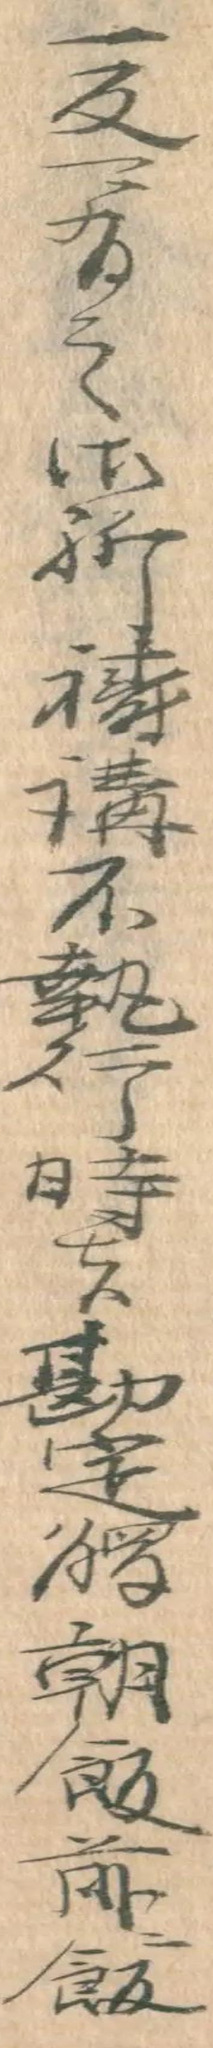一反可有之御祈祷講不執行時は勘定觸朝飯前ニ飯
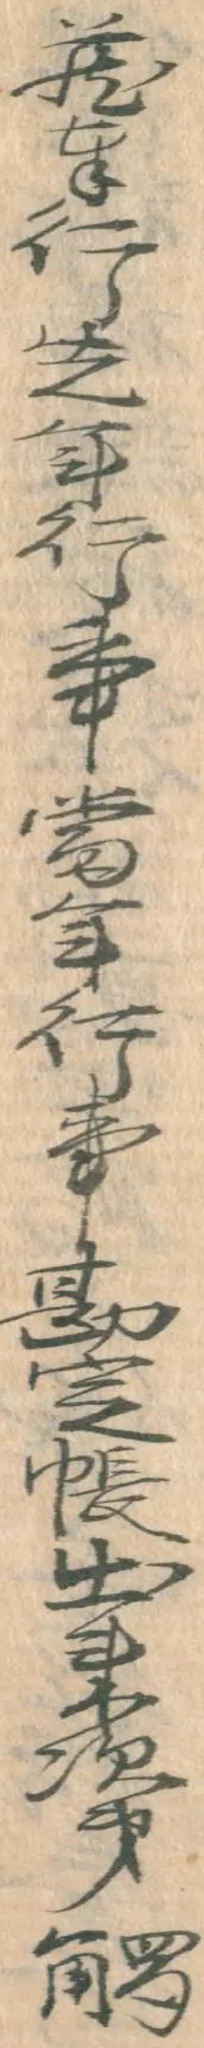蔵奉行先年行事當年行事勘定帳出来次第觸
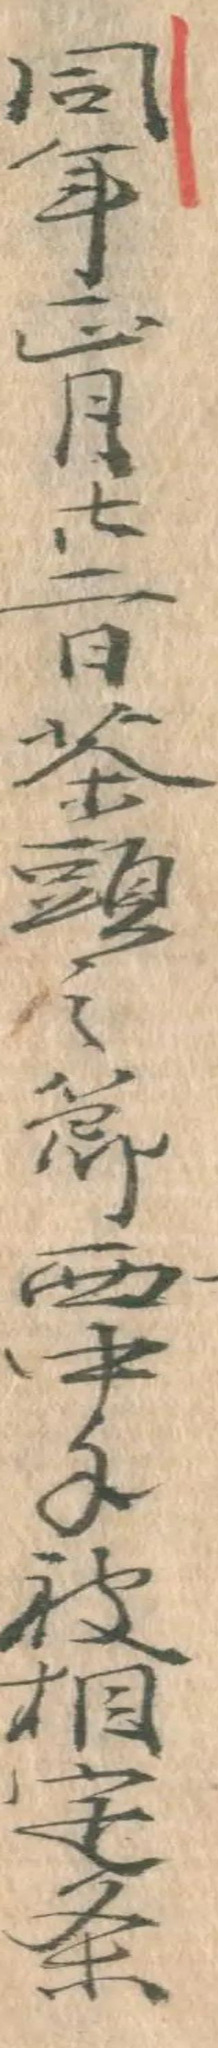同年正月廿二日茶頭之節西中手被相定条
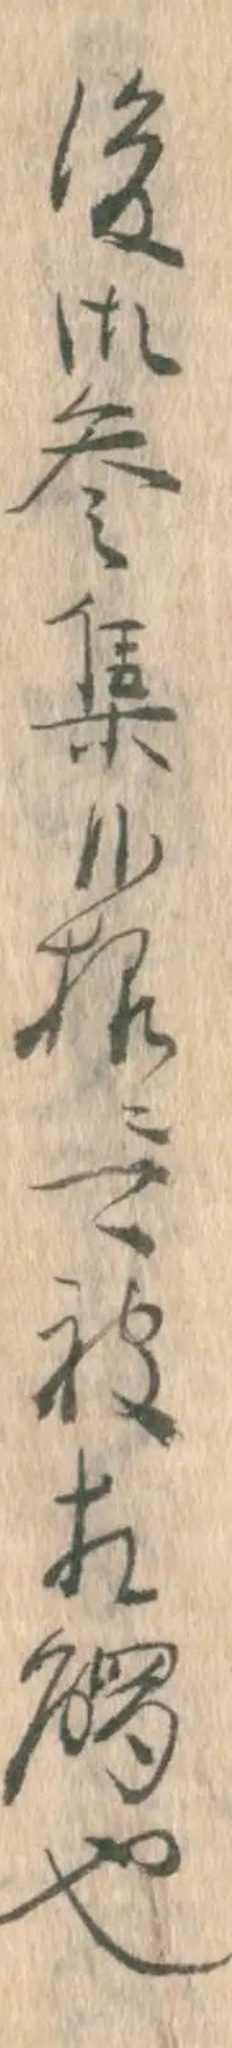後御参集候様に可被相觸也
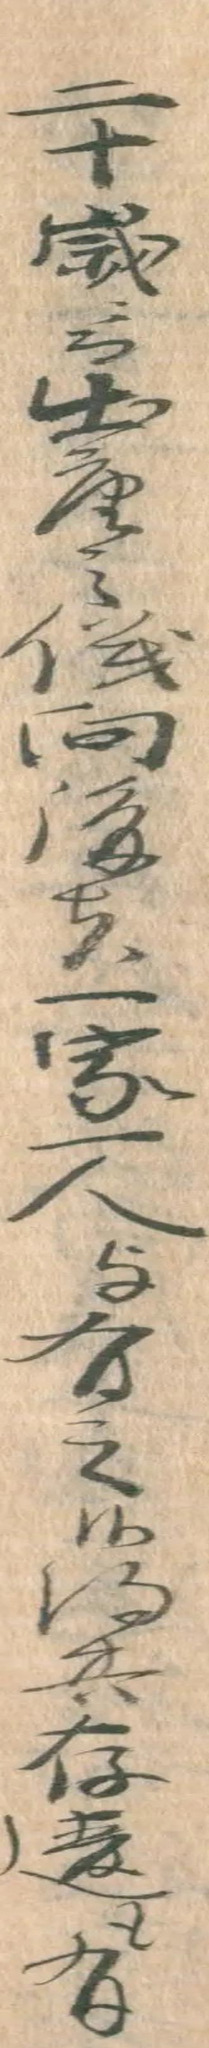一二十歳ニ而出座之儀向後者一家一人と有之候得共存違も有
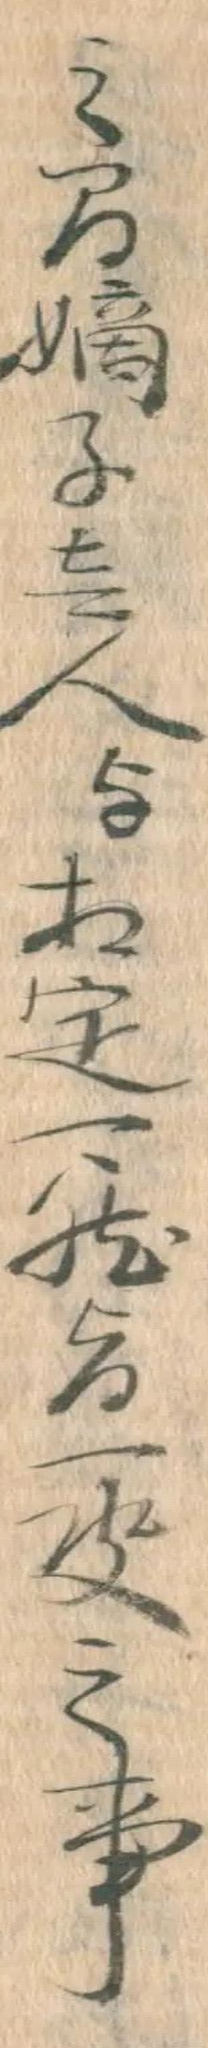之間嫡子壱人と相定可然旨一決之事
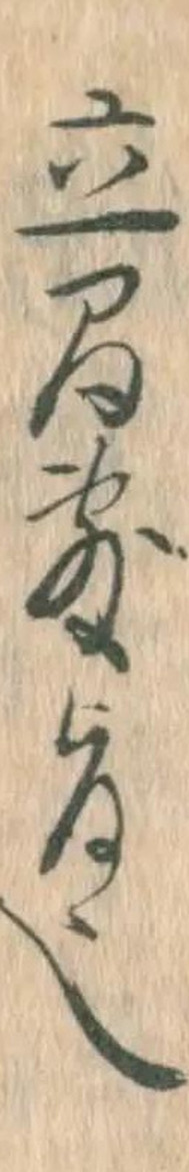立間敷旨也
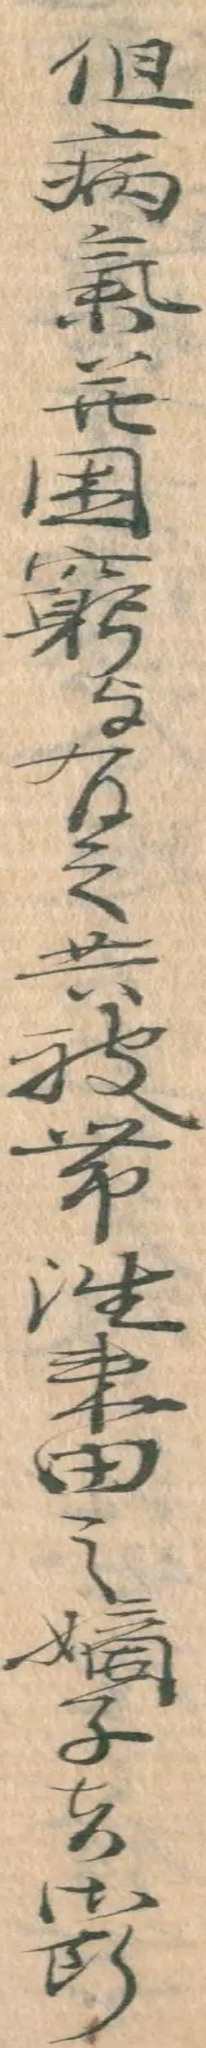但病氣并困窮と有之共被帯往来田之嫡子者御断
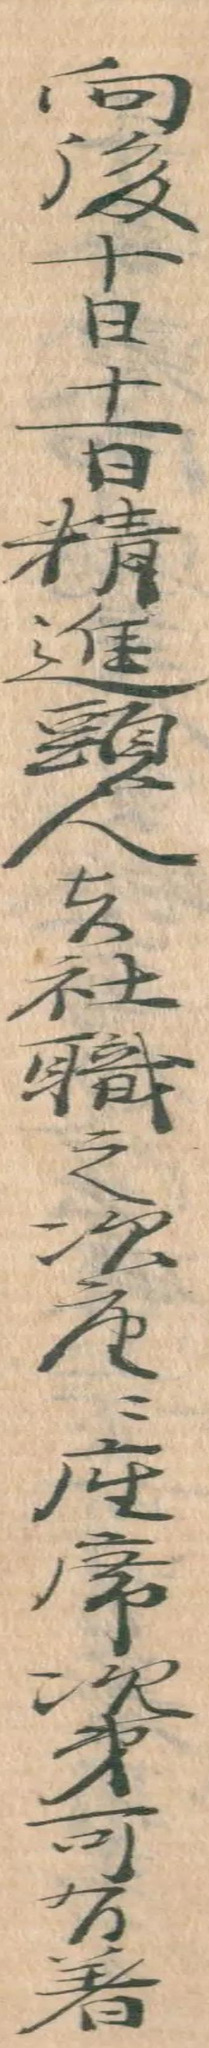一向後十日十一日精進頭人者社職之次座に座席次第可有着
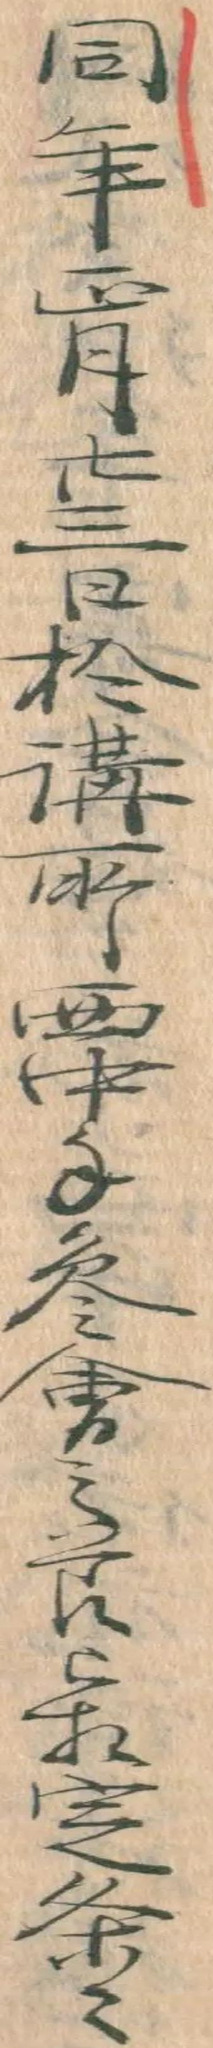同年正月廿三日於講所西中手参會之節被相定条々
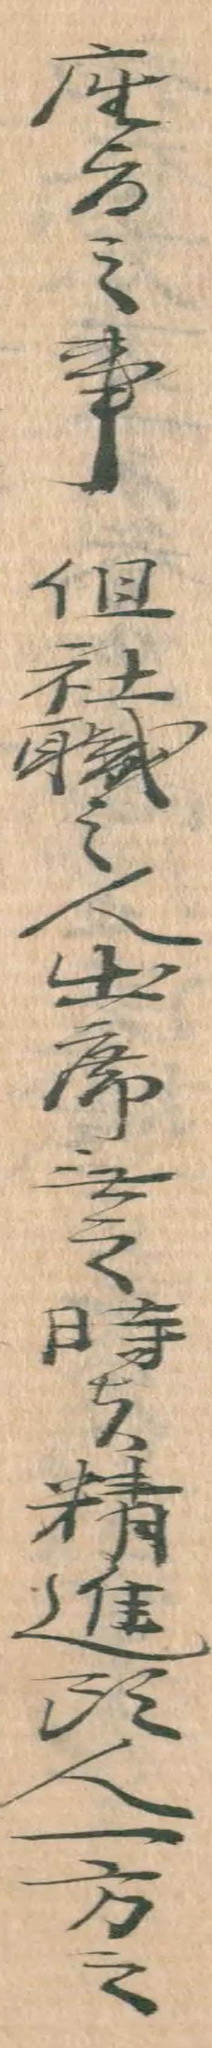座旨之事但社職之人出席無之時は精進頭人一方之
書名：賀茂社記録. 第29冊
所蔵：国立国会図書館 National Diet Library, JAPAN
